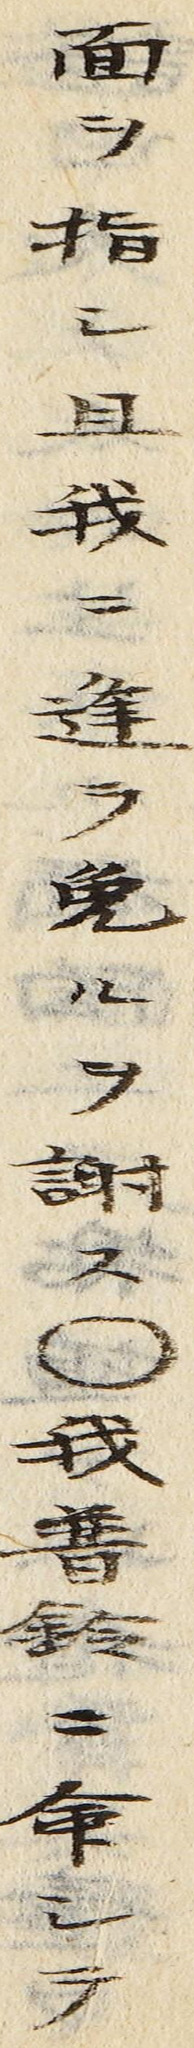面ヲ指シ且我ニ逢テ免ルヲ謝ス◯我普鈴ニ命シテ
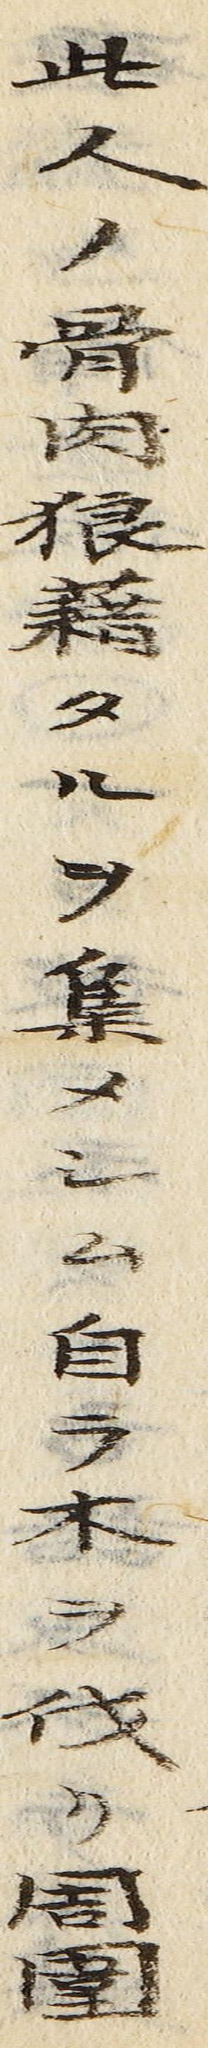此人ノ骨肉狼藉タルヲ集メシム自ラ木ヲ伐リ周囲
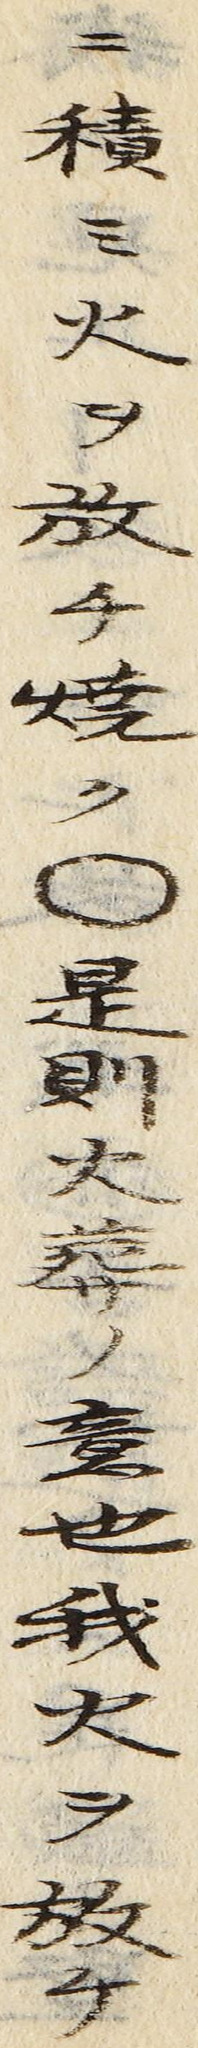ニ積ミ火ヲ放チ焼ク◯是則火葬ノ意也我火ヲ放チ
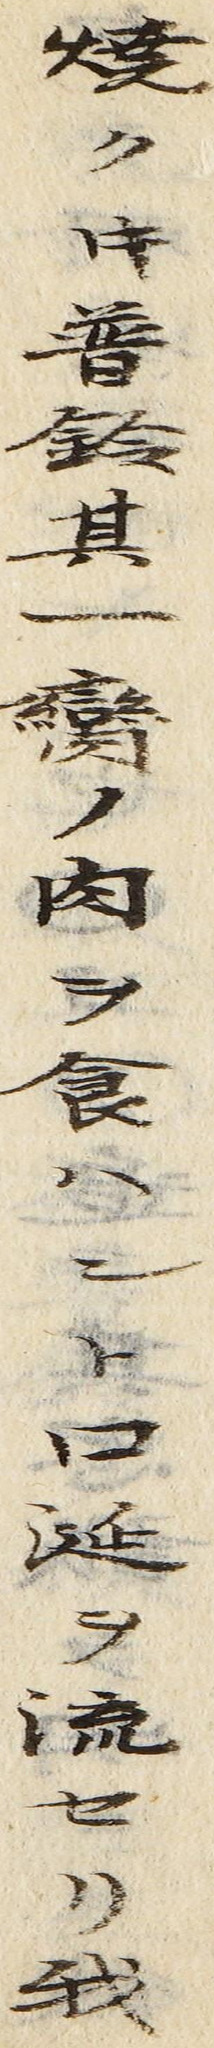焼クトキ普鈴其一臠ノ肉ヲ食ハント口涎ヲ流セリ我
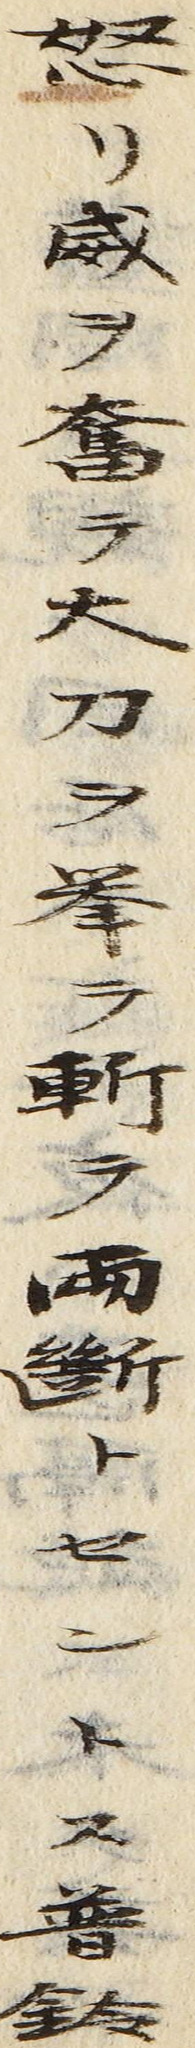怒リ威ヲ奮テ大刀ヲ挙テ斬テ両断トセントス普鈴
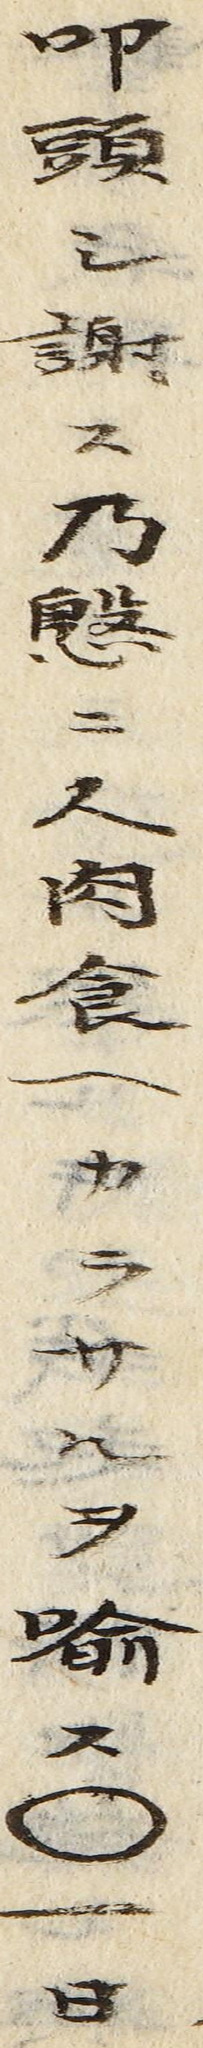叩頭シ謝ス乃慇ニ人肉食ヘカラサルヲ喩ス◯一日
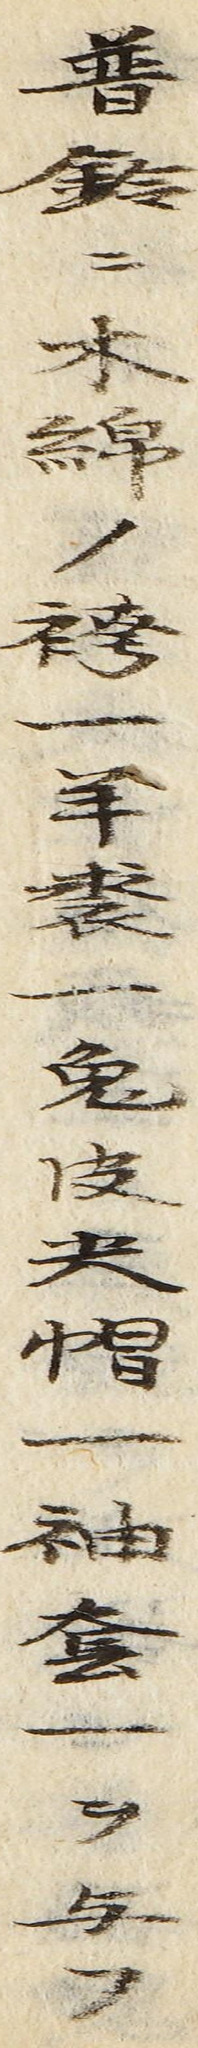普鈴ニ木綿ノ袴一羊裘一兎皮尖帽一袖套一ヲ与フ
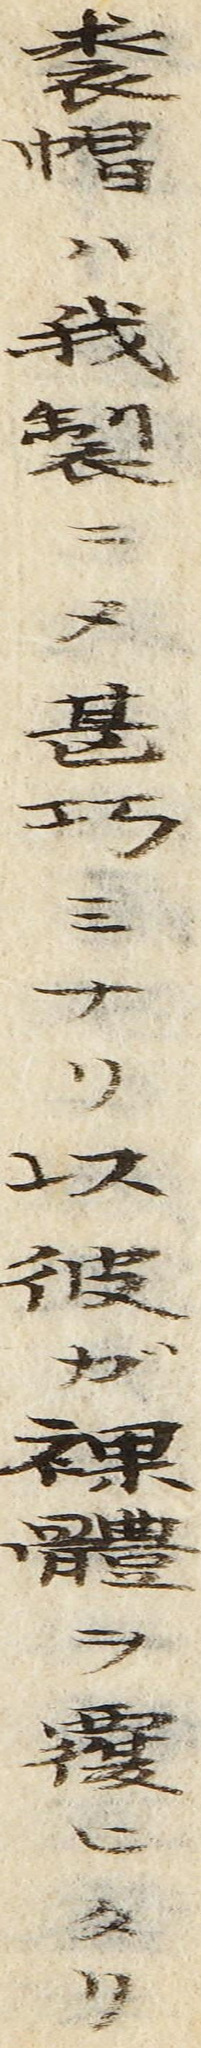裘帽ハ我製ニシテ甚巧ミナリ以彼ガ裸体ヲ覆ヒタリ
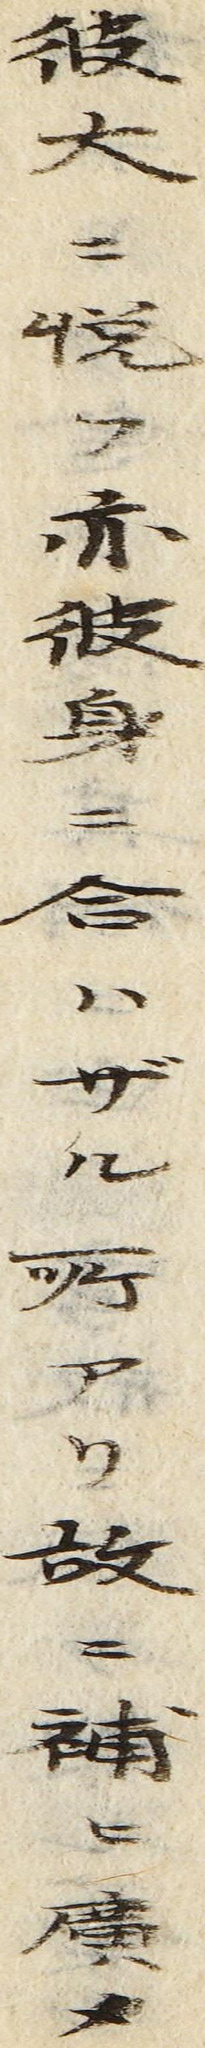彼大ニ悦フ亦彼身ニ合ハザル所アリ故ニ補ヒ広メ
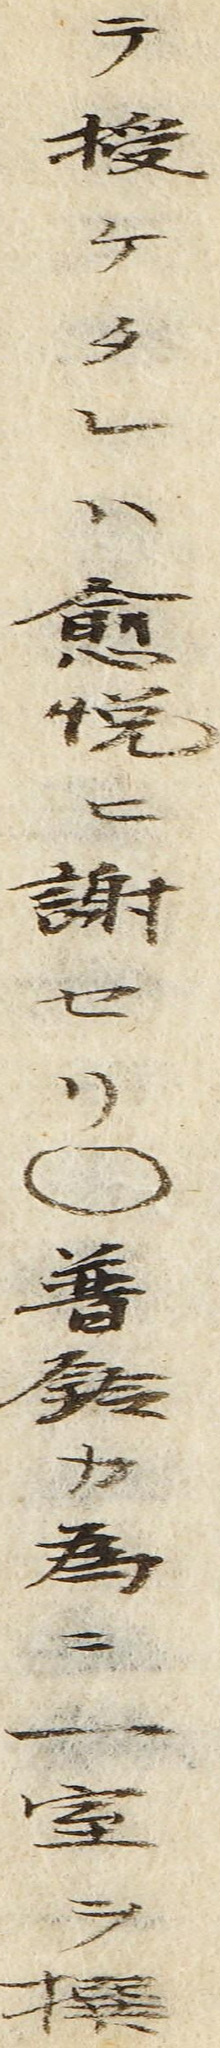テ授ケタレハ愈悦ヒ謝セリ◯普鈴カ為ニ一室ヲ撰
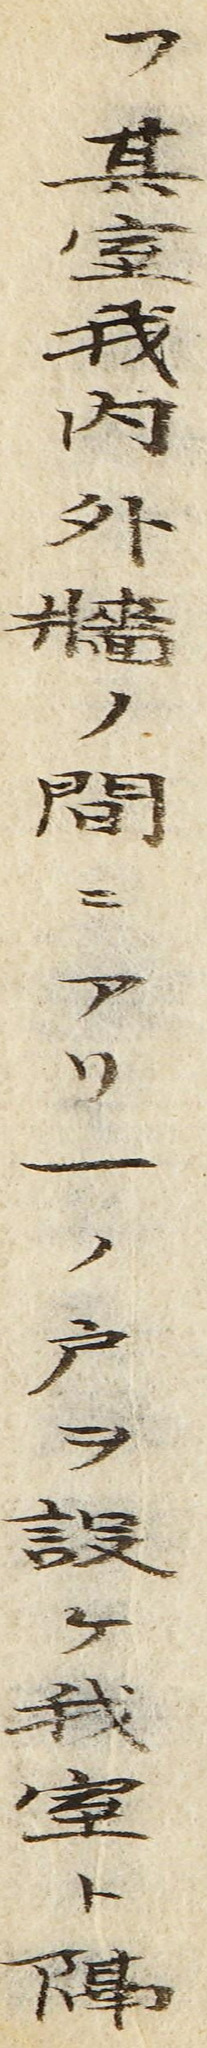フ其室我内外牆ノ間ニアリ一ノ戸ヲ設ケ我室ト隔

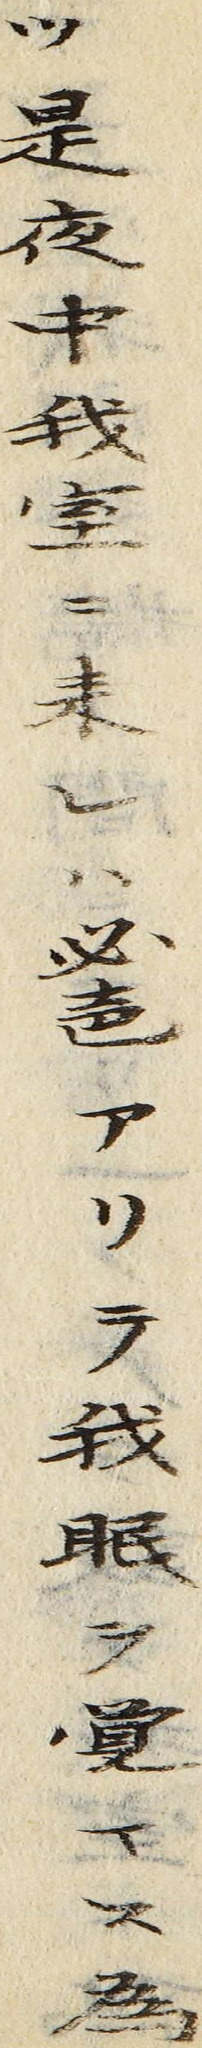ツ是夜中我室ニ来レハ必声アリテ我眠ヲ覚マス為
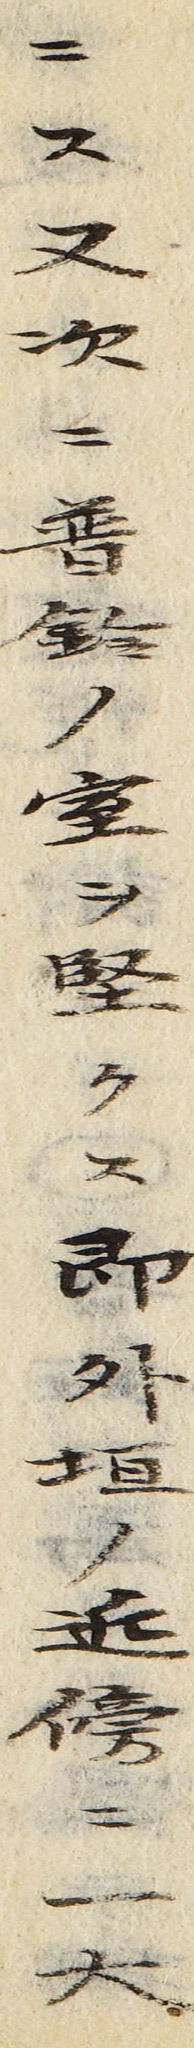ニス又次ニ普鈴ノ室ヲ堅クス即外垣ノ近傍ニ一大
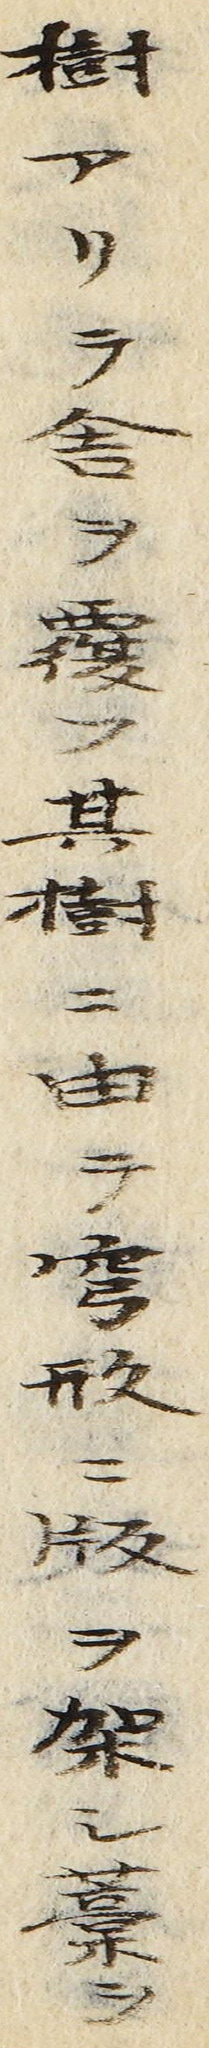樹アリテ舎ヲ覆フ其樹ニ由テ穹形ニ版ヲ架シ藁ヲ
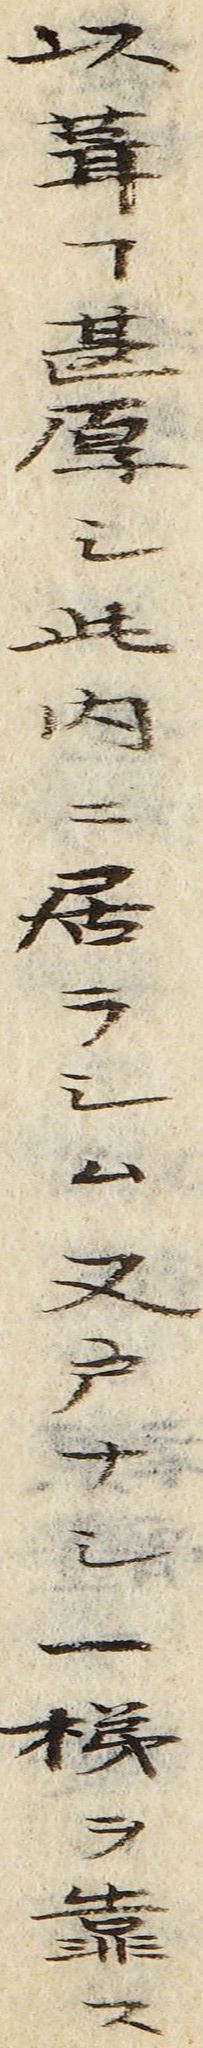以葺コト甚厚シ此内ニ居ラシム又戸ナシ一梯ヲ靠ス
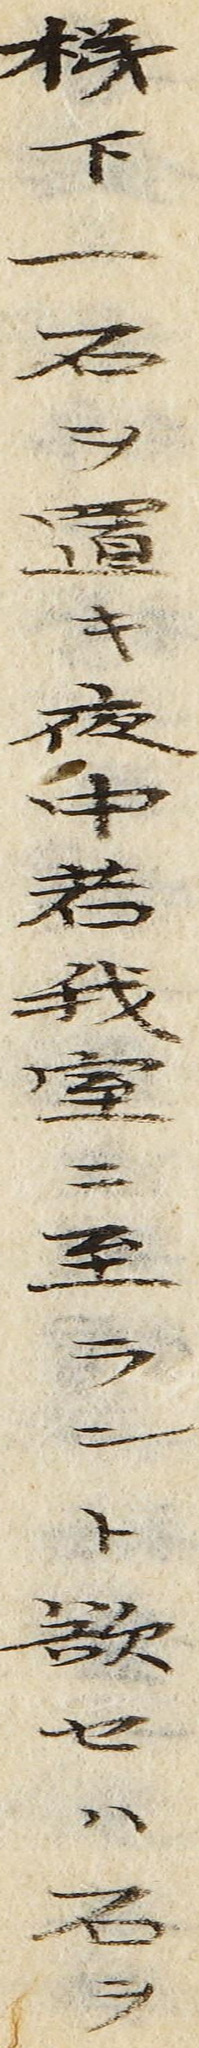梯下一石ヲ置キ夜中若我室ニ至ラント欲セハ石ヲ
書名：漂流紀事
